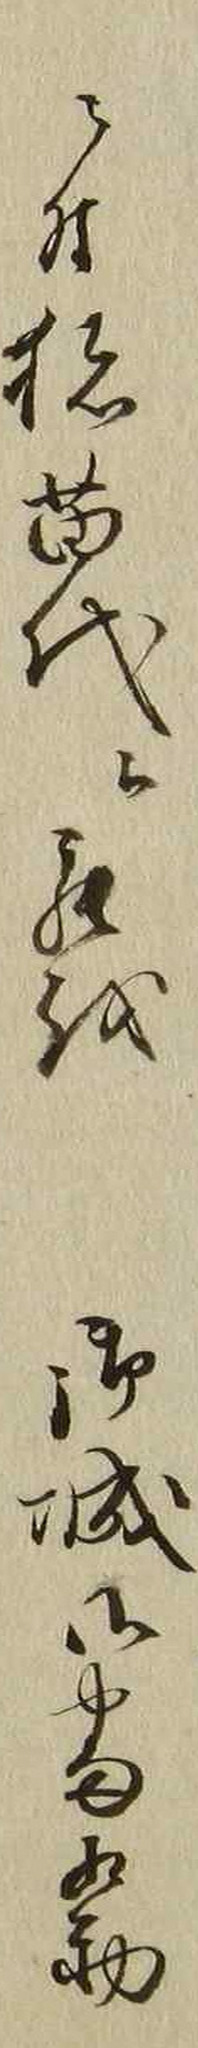ニ付猪苗代江罷越御城御番相勤
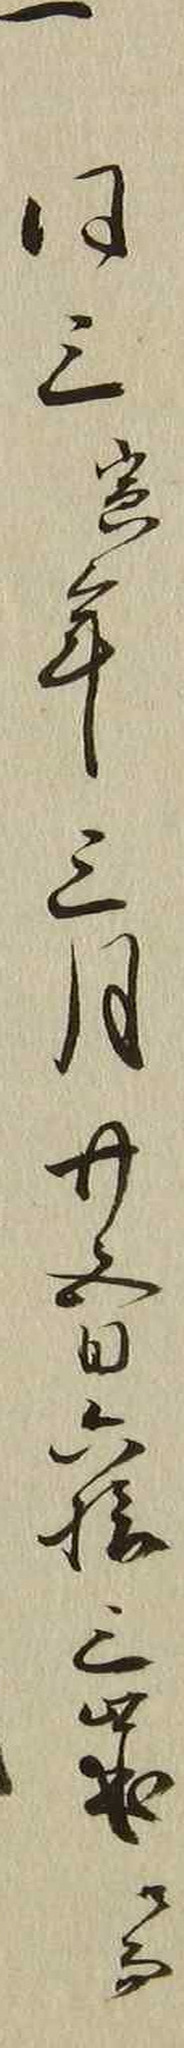一同三寅年三月廿五日六拾参歳ニ而
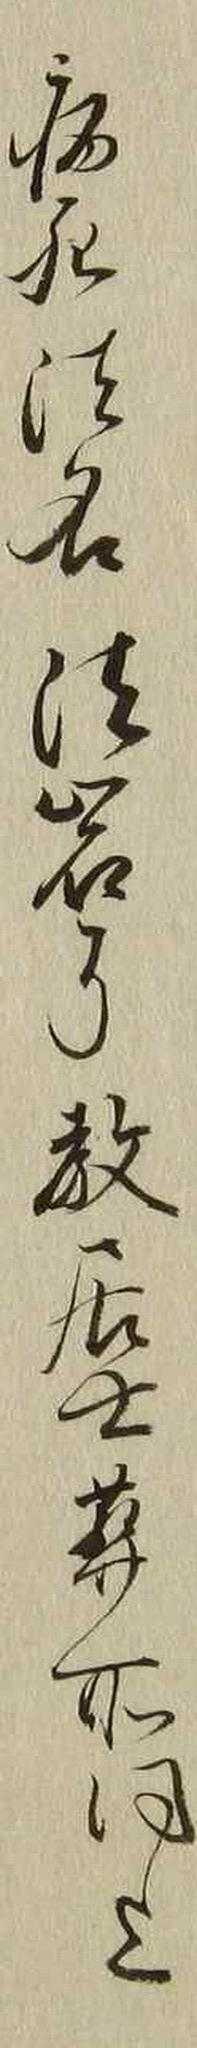病死法名法岩了教居士葬所同上
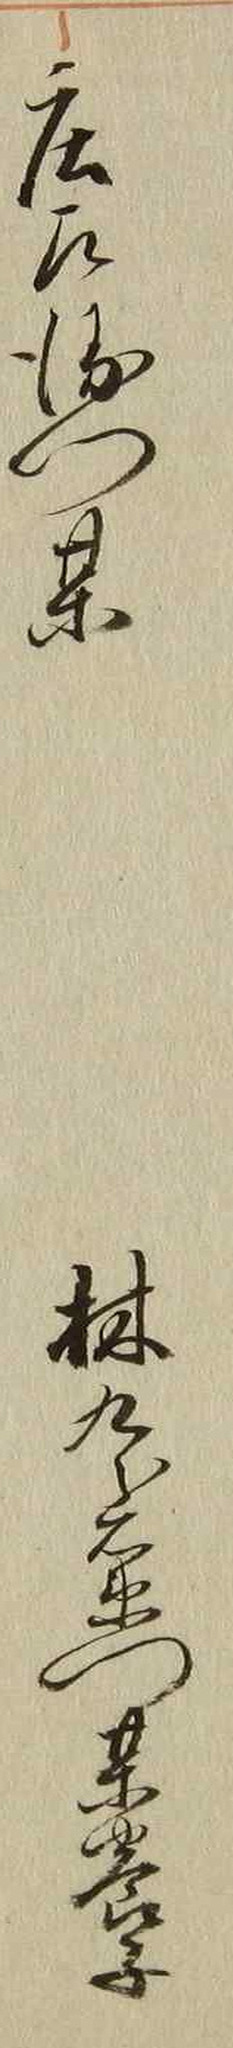庄左衛門某林九郎右衛門某養子
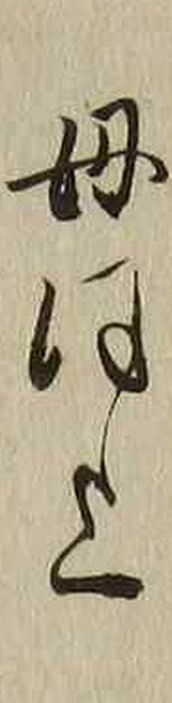母同上
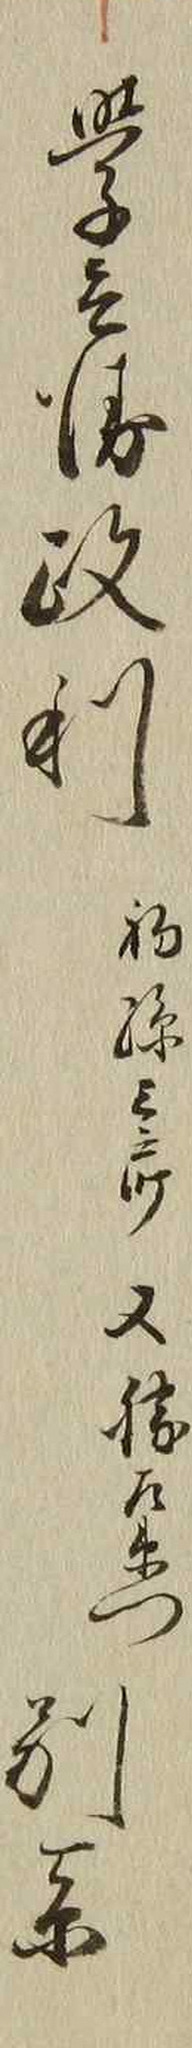学兵衛政利初孫三郎又勝左衛門別系
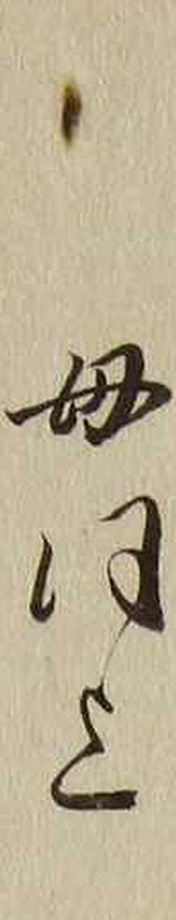母同上
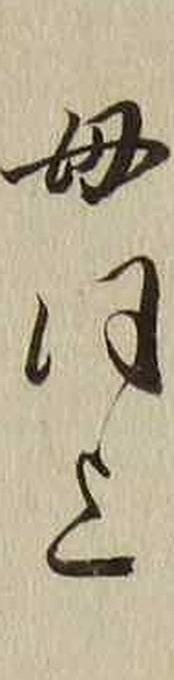母同上
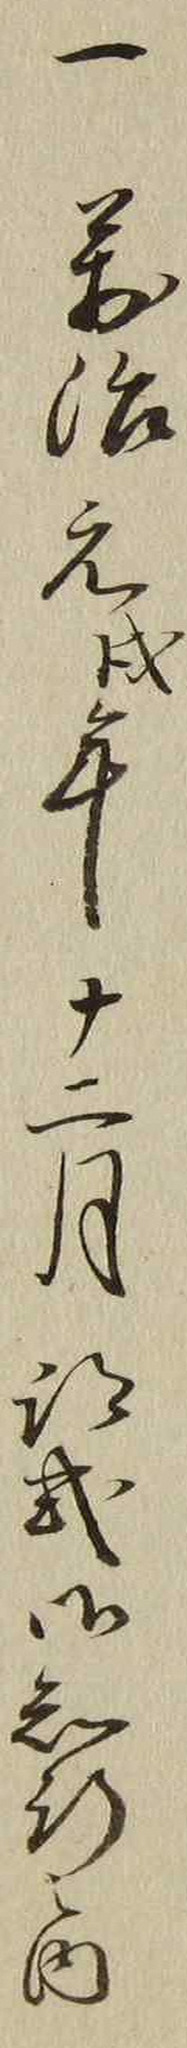一万治元戌年十二月跡式御知行之内
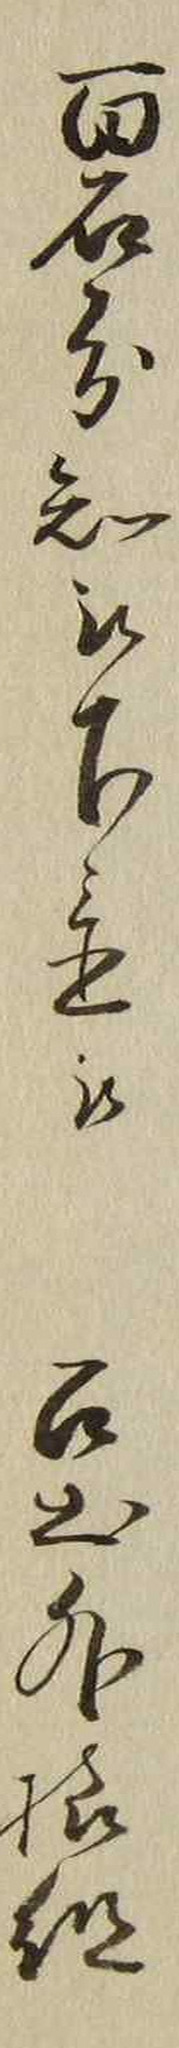百石分知被下置被召出外様組
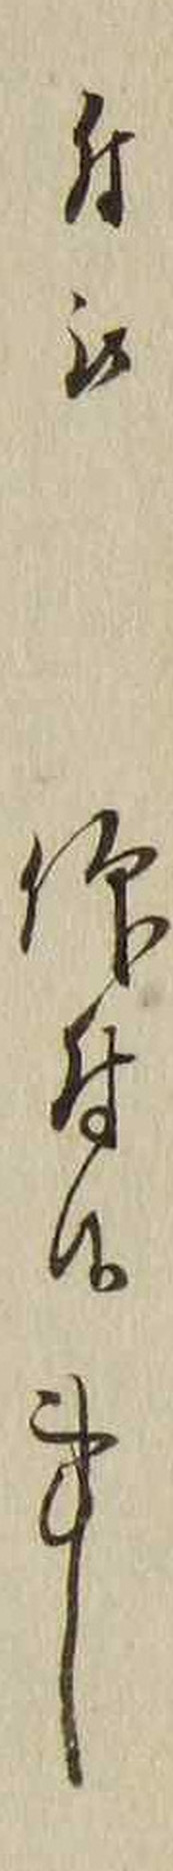付被仰付候事
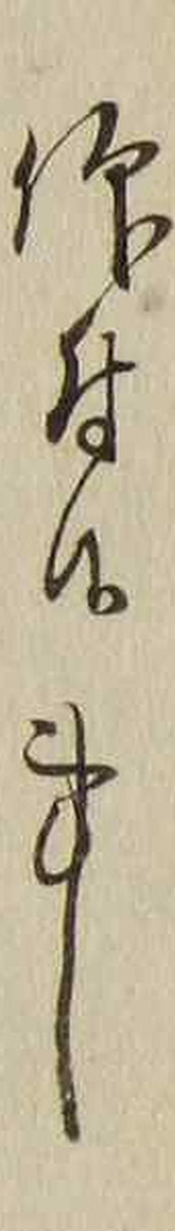仰付候事

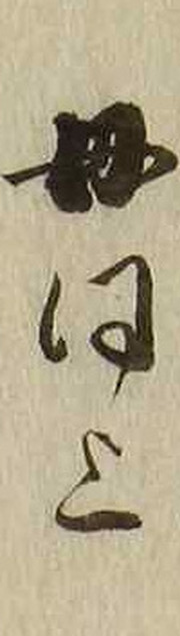母同上
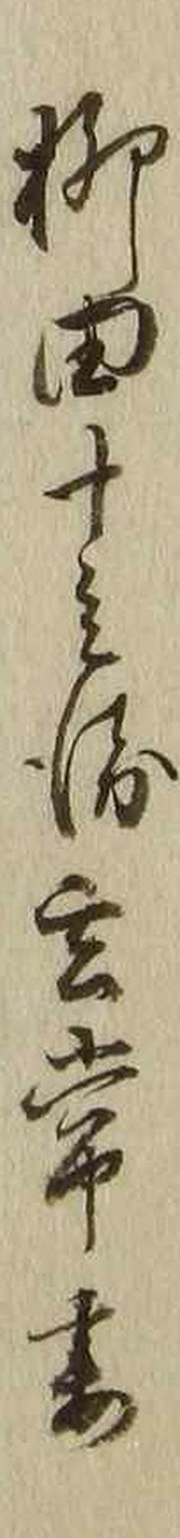女柳田十兵衛玄常妻
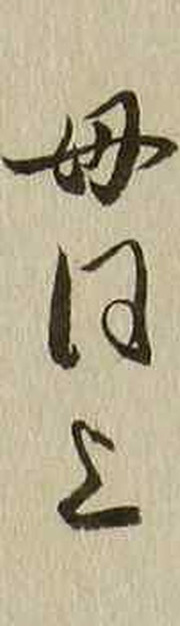母同上
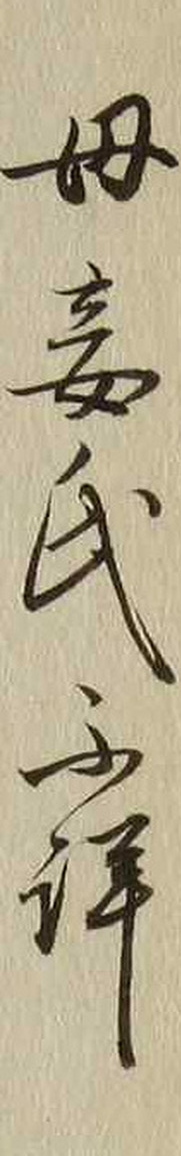母妾氏不詳
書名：諸士系譜　巻之68　を之部2
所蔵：会津若松市立会津図書館
